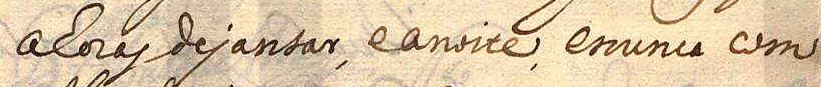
a horas de jantar, e a noite e nunca com
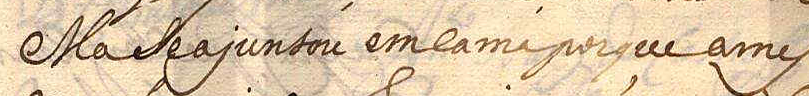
ella se ajuntou em cama porque a mes
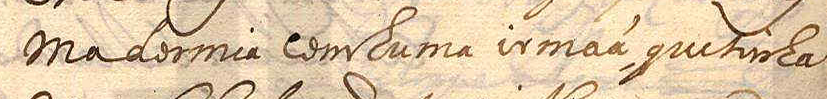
ma dormia com huma irmaā, que tinha
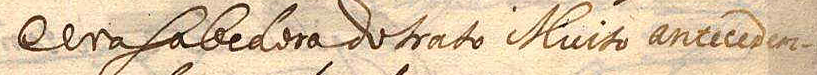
e era sabedora do trato Muito anteceden
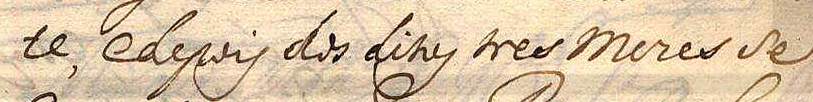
te, e depois dos ditos tres mezes se
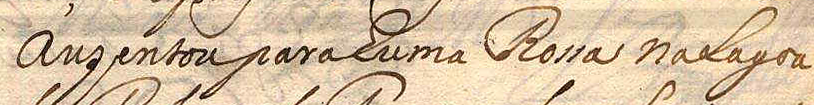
auzentou para huma Rossa na Lagoa
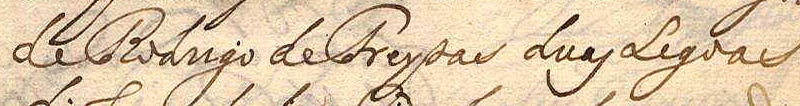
de Rodrigo de Freytas duas Legoas
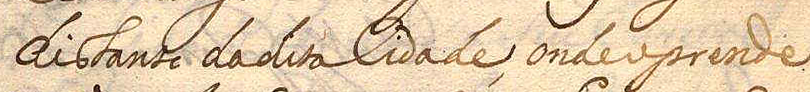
distante da dita Cidade, onde o prende
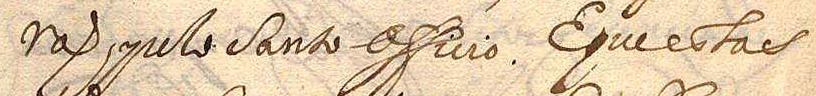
raõ pelo Santo officio. E que estas
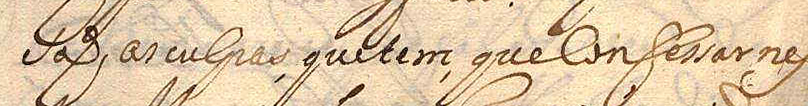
saõ as culpas que tem, que Confessar nes
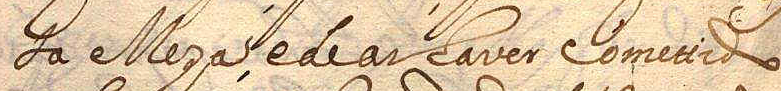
ta Meza, e de as haver comettido
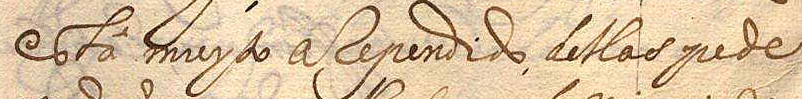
está muyto aRependido, dellas pede
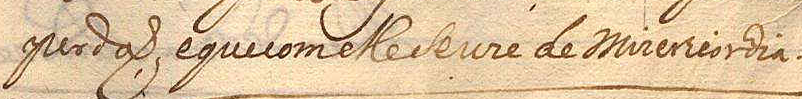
perdaõ, e que com elle se uze de mizericordia
